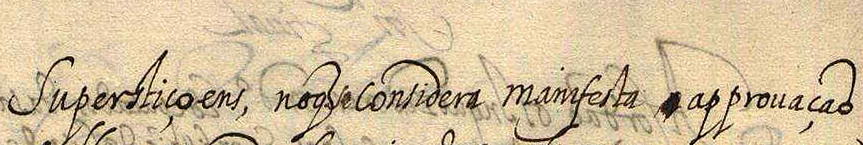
Superstiçoens, no q̄ se considera manifesta _ approuação
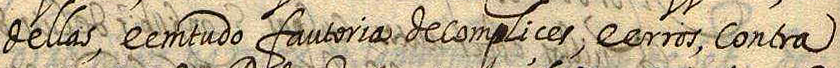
dellas, e em tudo fautoria de complices, e erros, contra
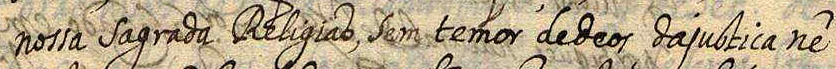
nossa Sagrada Religião, sem temor de deos da justiça nē
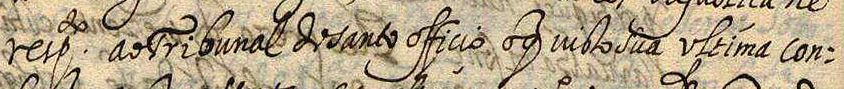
respto. ao Tribunal do santo officio o q̄ uisto sua vltima con
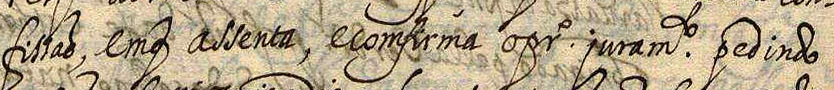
fissaõ, em q̄ assenta, e comfirma o pro. juramto. pedindo
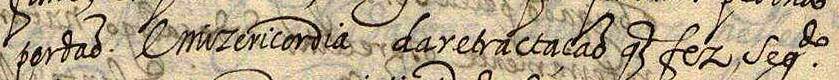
perdão e mizericordia da retractação q̄ fez seg.do
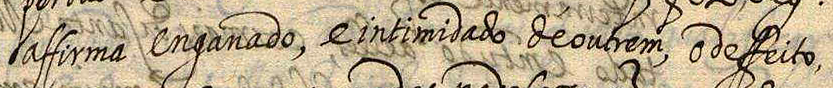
affirma enganado, e intimidado de outrem, o deffeito,
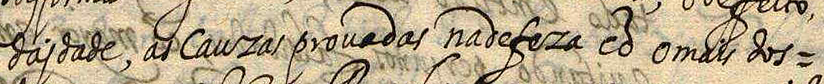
da jdade, as cauzas prouadas na defeza cō o mais dos
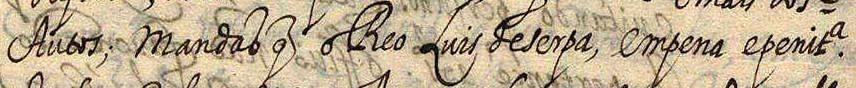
Autos; mandaõ q̄ o Reo Luis de serpa, em pena e penita.
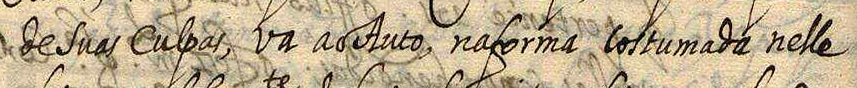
de Suas culpas, va ao Auto, na forma costumada nelle
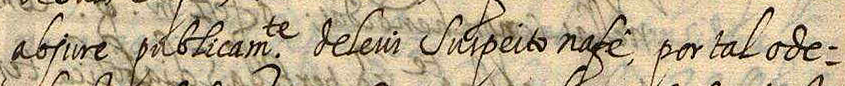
abjure publicam.te de leui Suspeito na fé, por tal o de
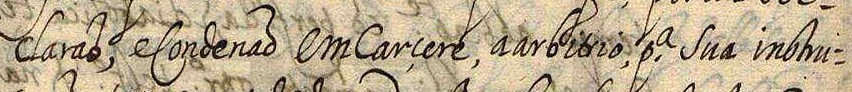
claraõ, e Condenão em Carcere, a arbitrio, p.a Sua instru
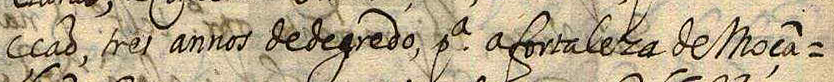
cção, tres annos de degredo, pa. a fortaleza de Moçā
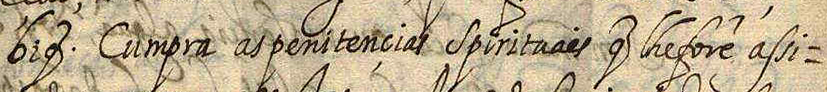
biq̄. Cumpra as penitencias Spirituaes q̄ lhe forē assi
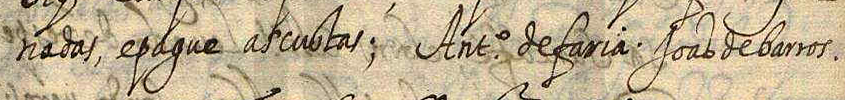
nadas, e pague as custas; Ant.o de faria. João de barros.
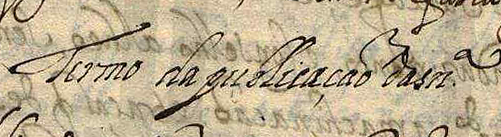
Termo da publicaçaõ da sna.
